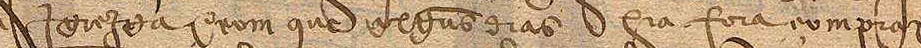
a JgreJga e com que algūs dias hia fora çomprar
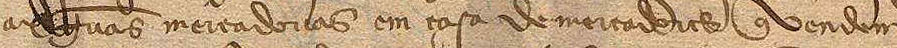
algūas mercadorias em casa de mercadores q̄ vendem
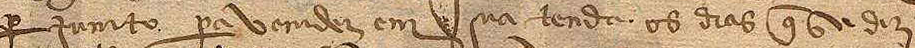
ꝑ Jumto ꝑa vemder em sua tenda. os dias q̄ se diz
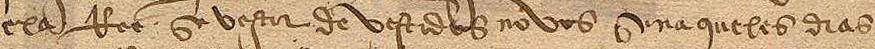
ela Ree . se vestir de vestidos novos se naqueles dias
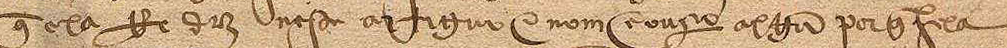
q̄ ela Re diz neste artiguo e nom ē outro algū porq̄ hela
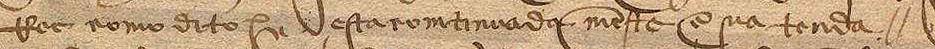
Ree como dito he esta comtinuadamēte ē sua tenda //
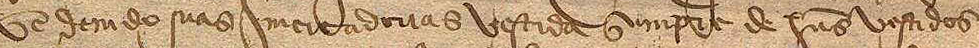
vēdemdo suas mercadorias vestida sempre de hūs vestidos
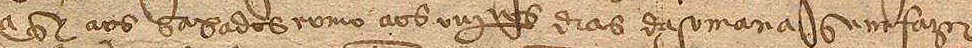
asy aos sabados como aos outros dias da somana sem fazer
